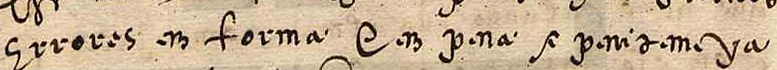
Errores em forma e em pena e penitemcya
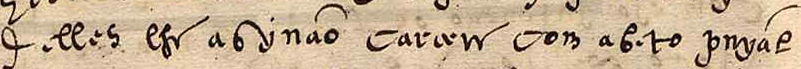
delles lhe asynão carcere com abito pnyāl
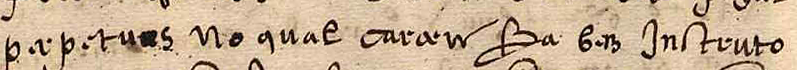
perpetuos no qual carcere ꞩa bem Jnstruto
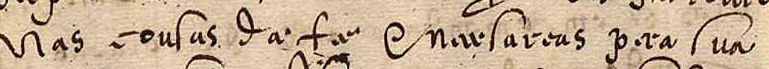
nas cousas da fee e necesareas pera sua
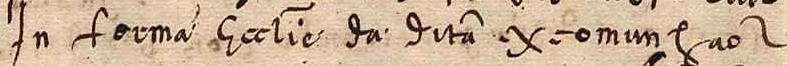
Jn forma Ecclīe da ditā eXcomunhaõ
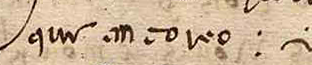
que emcoreo
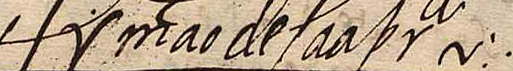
Symão de Saa pra
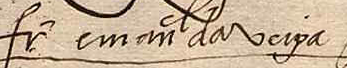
fr̄ emanel da veiga
